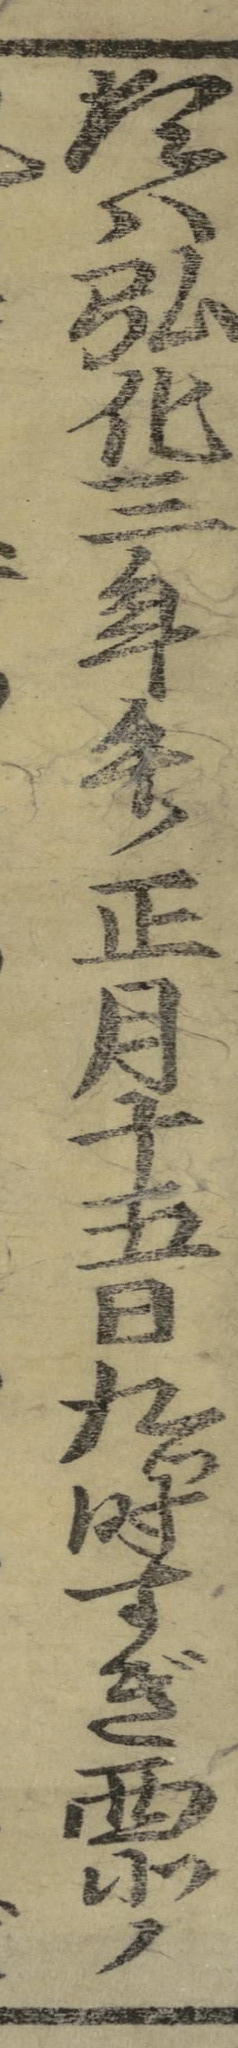頃は弘化三年午ノ正月十五日九ツ時すぎ西北ノ
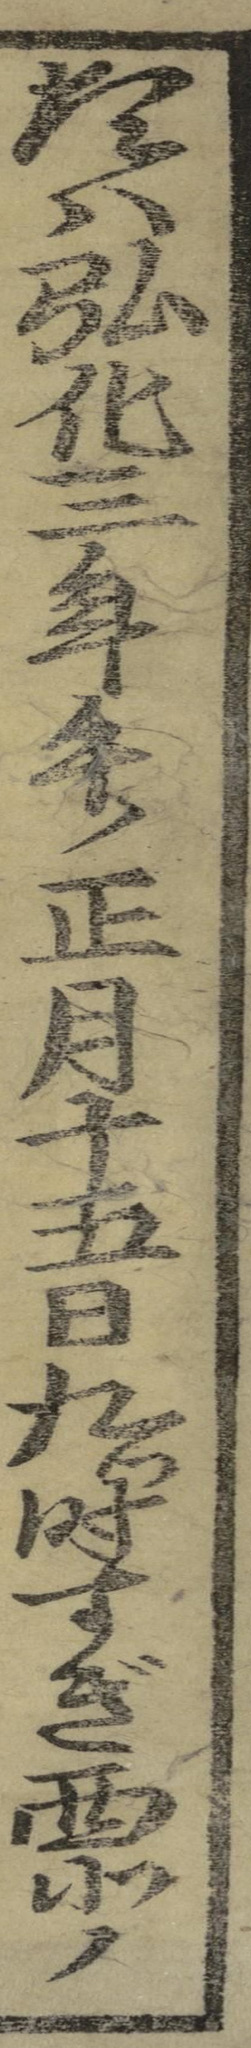頃は弘化三年午ノ正月十五日九ツ時すぎ西北ノ
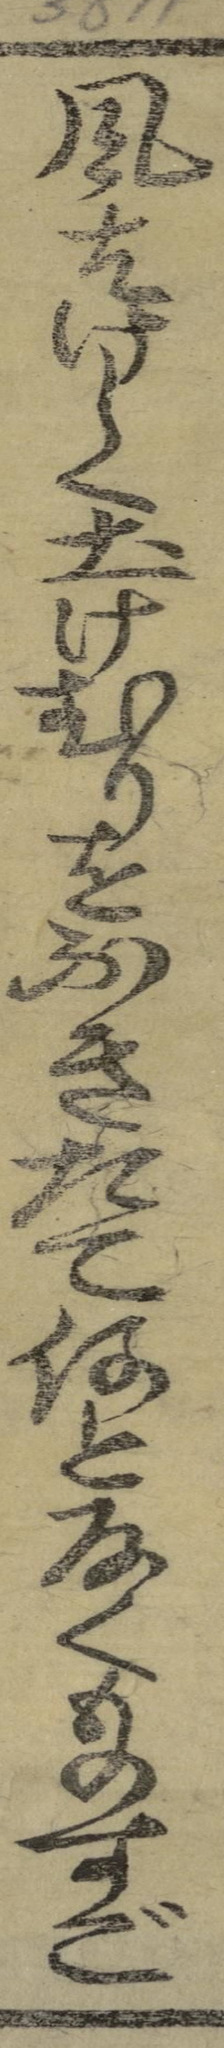風はげしく土けむりをふきたて何となくものすご
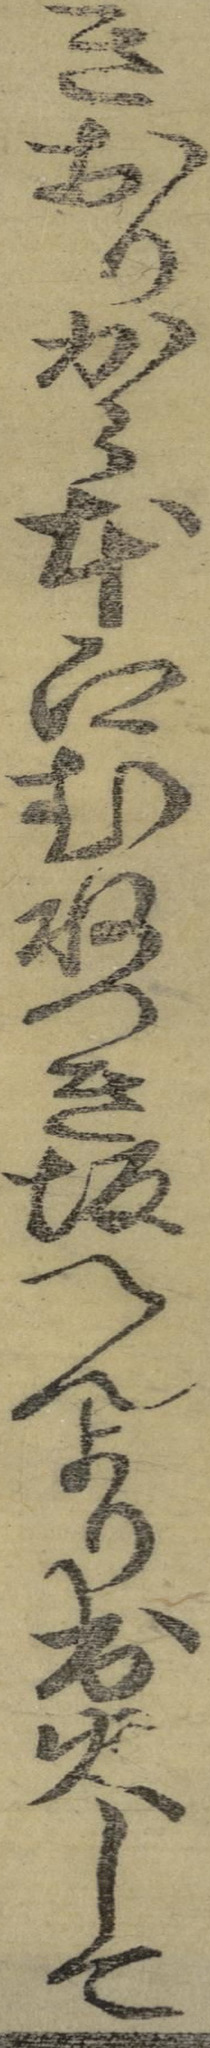きおりから本郷むねつき坂へんより出火して
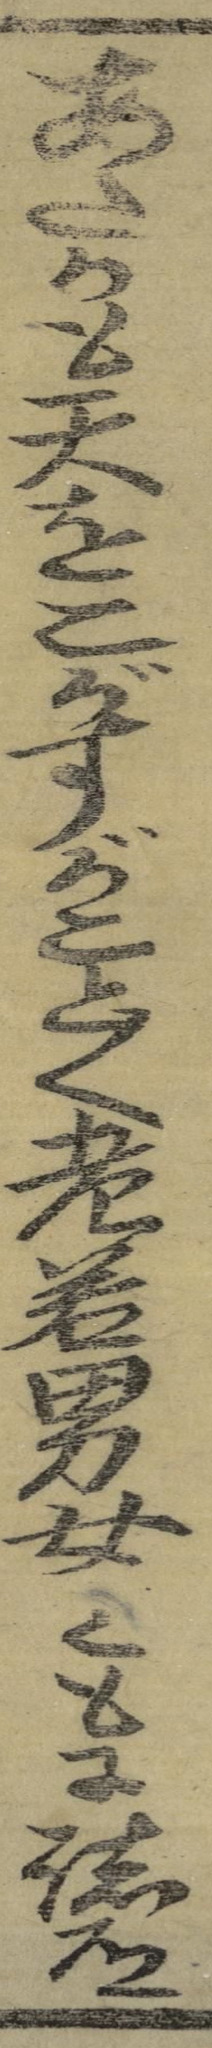あたかも天をこがすがことく老若男女ともに諸道
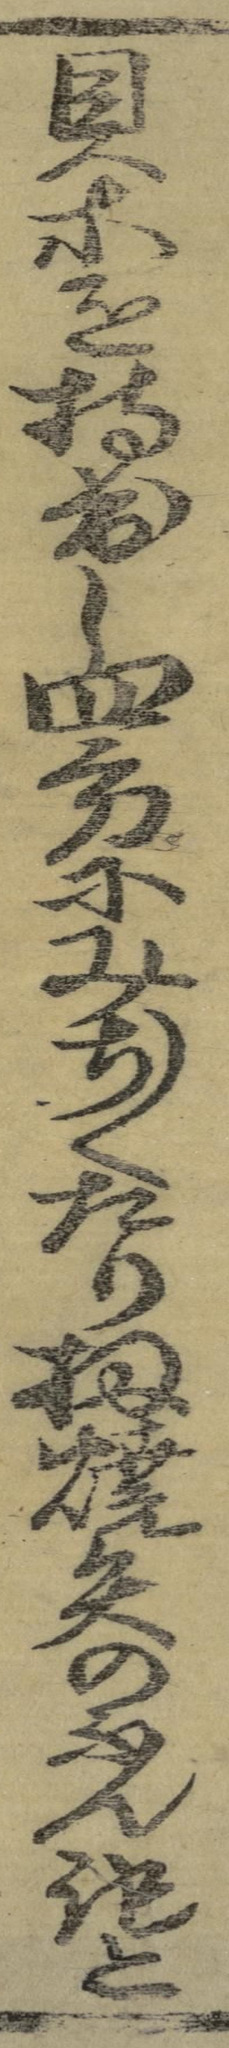具等を持出し四方にみち〳〵たり扨焼失のふん胙と
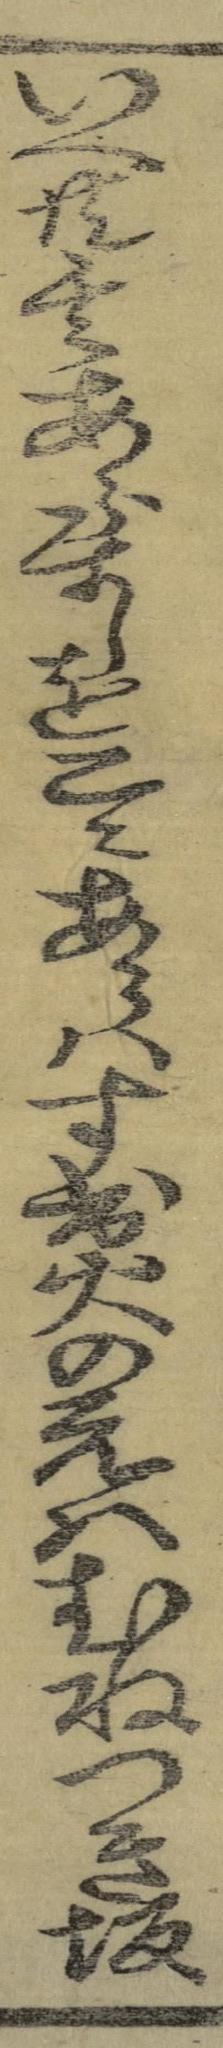いへ共其あらましをこゝあらはす出火の元はむねつき坂
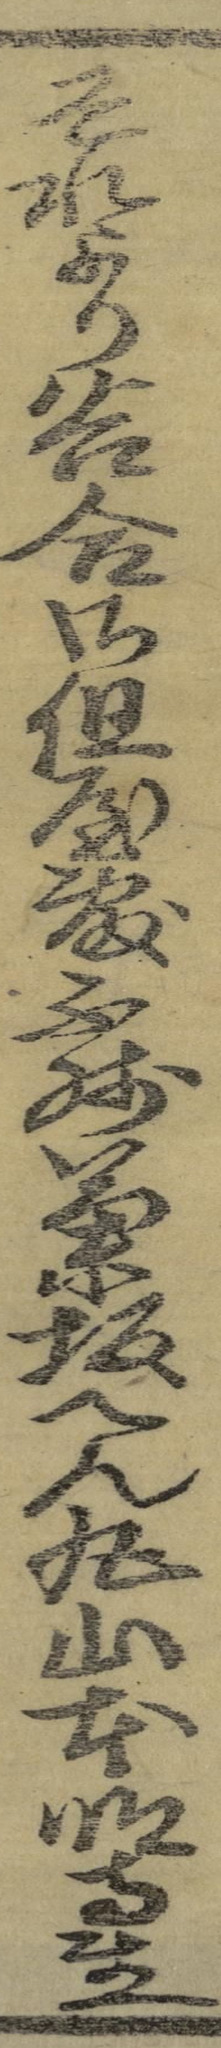それより谷合御組屋敷不残菊坂へん丸山本明寺まへ
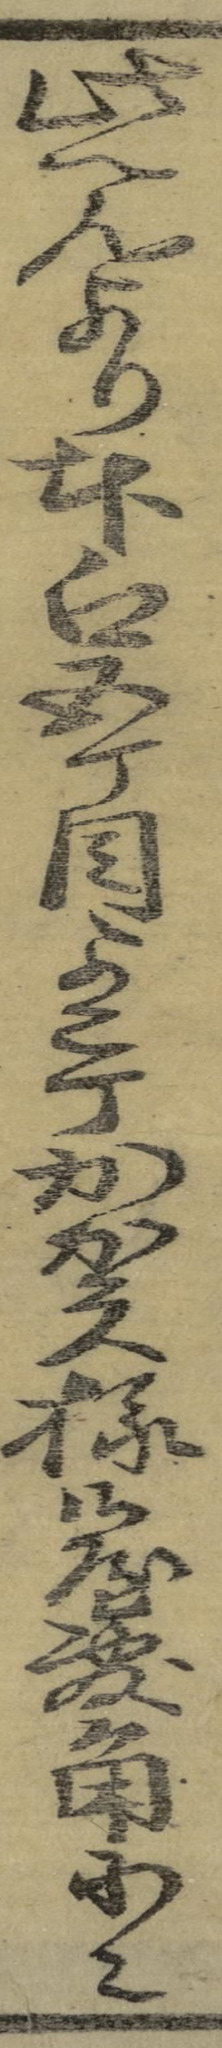此へんより本郷五丁目よこ丁加賀様御家敷角少〻
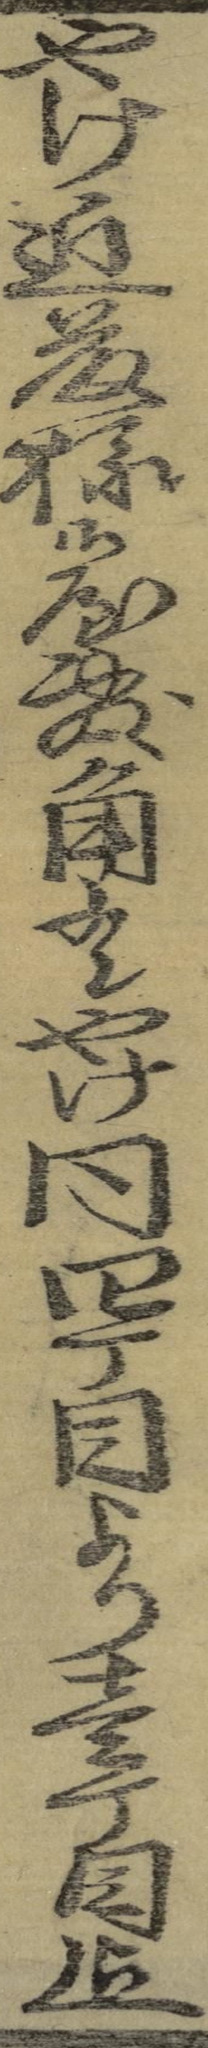やけ近藤様御屋敷角少しやけ同四丁目より壱丁目迄
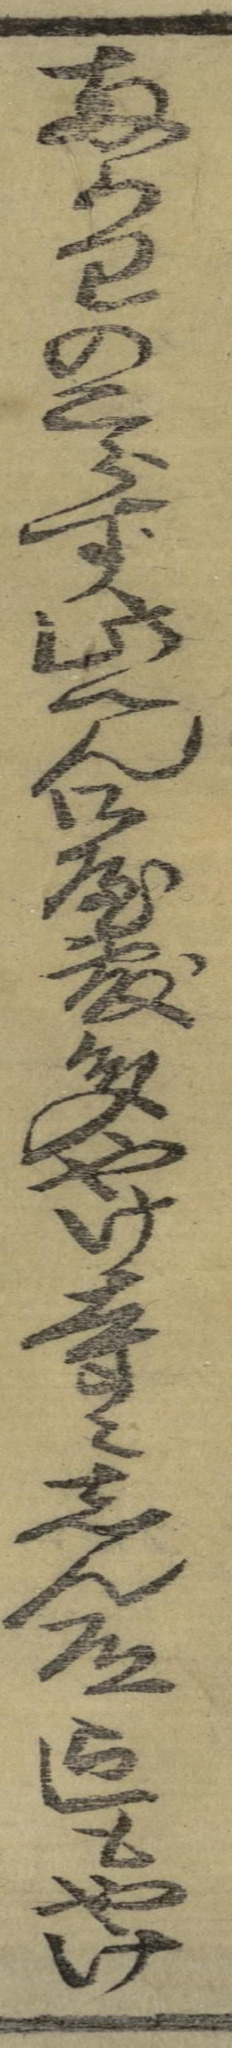両かわのこらず此へん御屋敷多やけ寺〻しん道迄もやけ
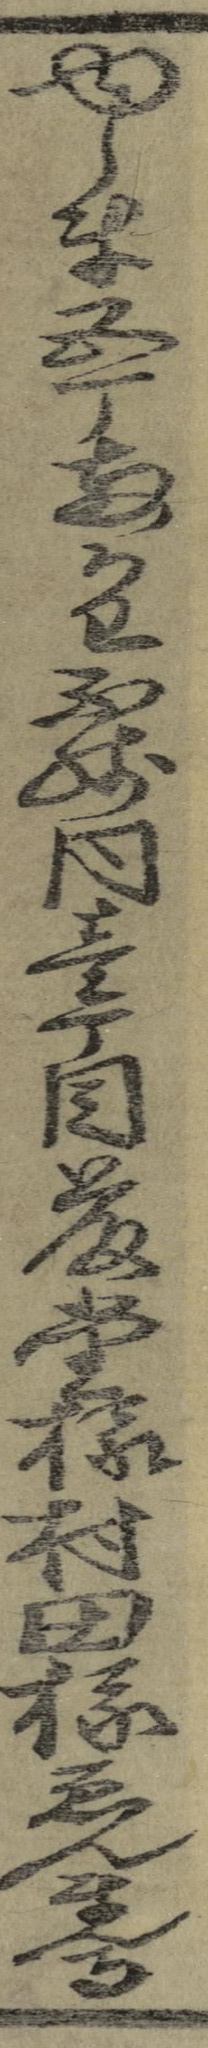ゆしま五丁両かわ不残同壱丁目藤堂様村田様ゑんまん寺
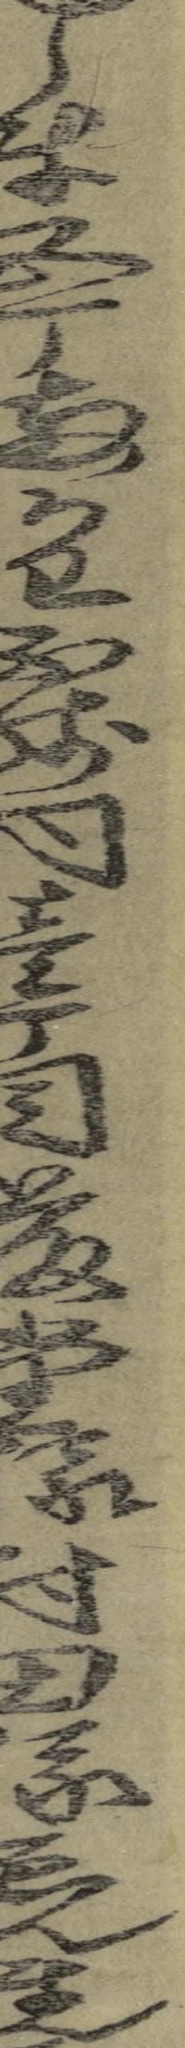ゆしま五丁両かわ不残同壱丁目藤堂様村田様ゑんまん寺
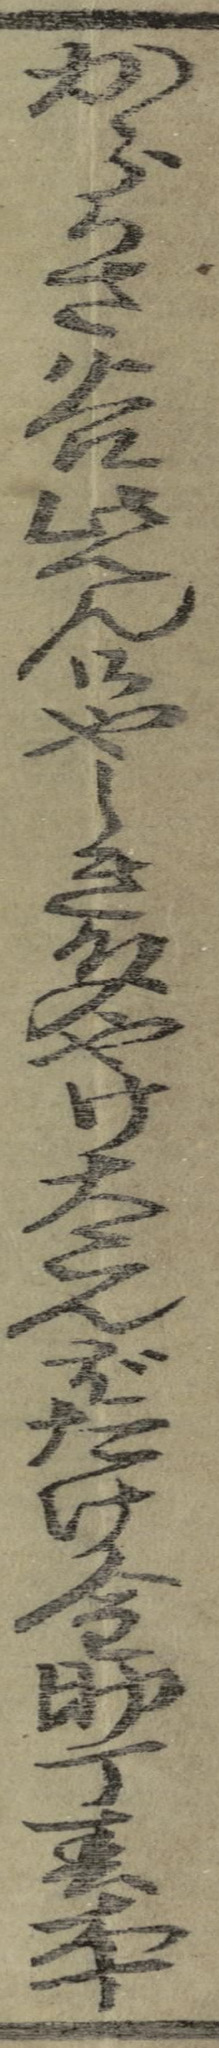からかさ谷此へん御やしき多やけ大こんばたけ金助丁春木丁
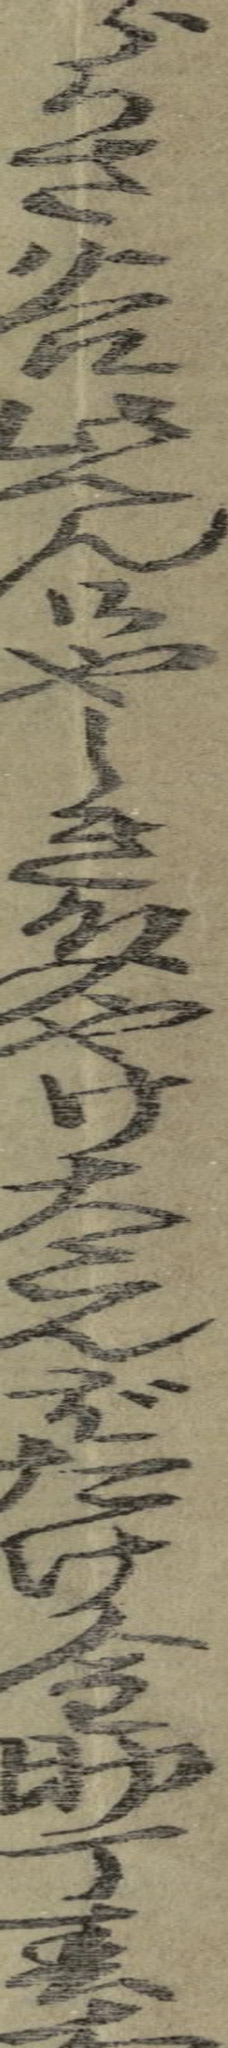からかさ谷此へん御やしき多やけ大こんばたけ金助丁春木丁
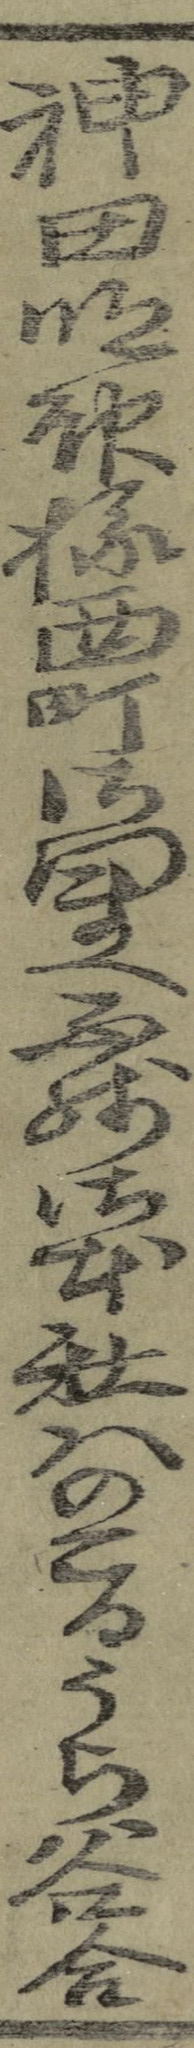神田明神様西町御門まへ不残御本社はのこるうら谷合
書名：[弘化三年一月の江戸大火に関する瓦版]
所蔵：東京大学地震研究所図書室 Earthquake Research Institute Library, The University of Tokyo, JAPAN
